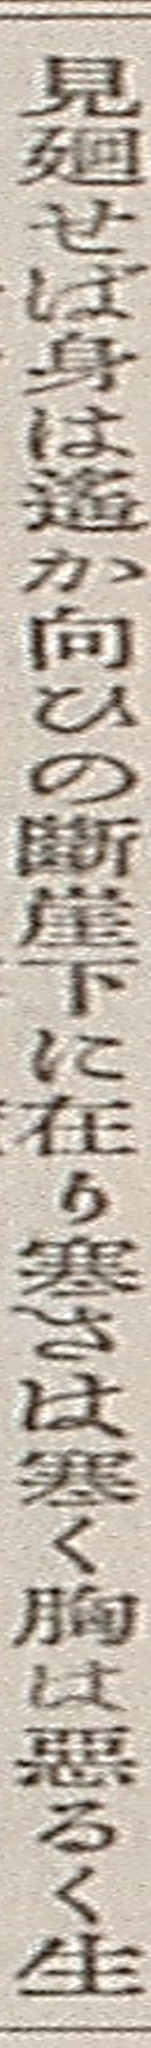見廻せば身は遙か向ひの断崖下に在り寒さは寒く胸は悪るく生
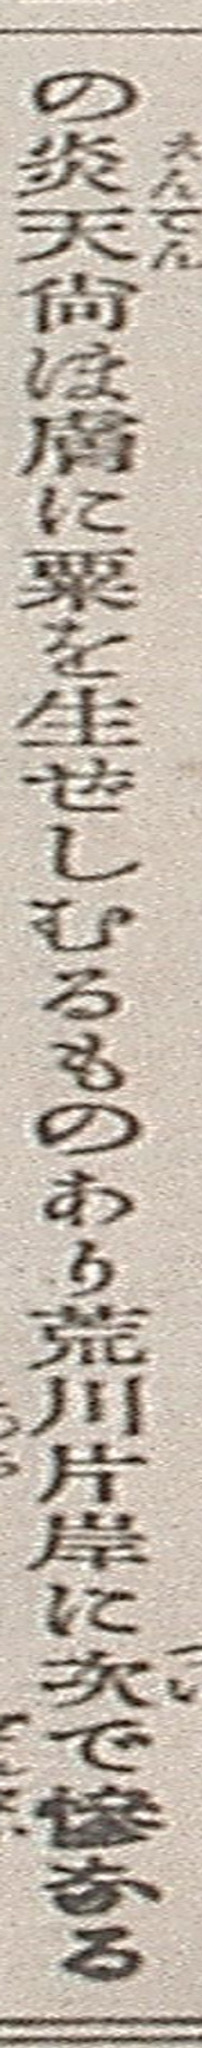の炎天尚ほ膚に粟を生ぜしむるものあり荒川片岸に次で惨なる
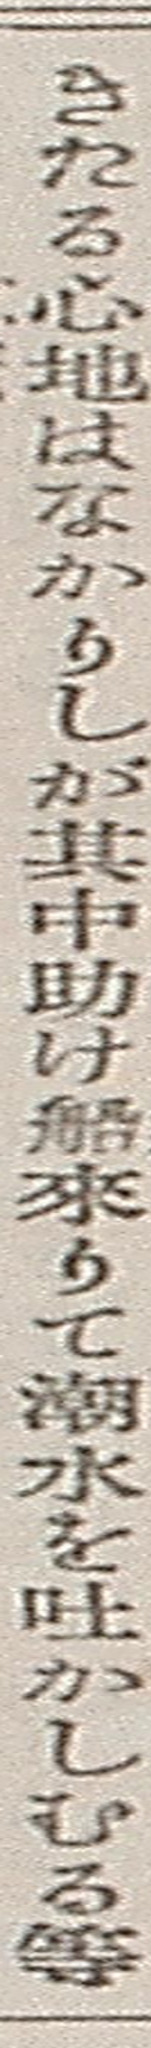きたる心地はなかりしが其中助け船来りて潮水を吐かしむる等
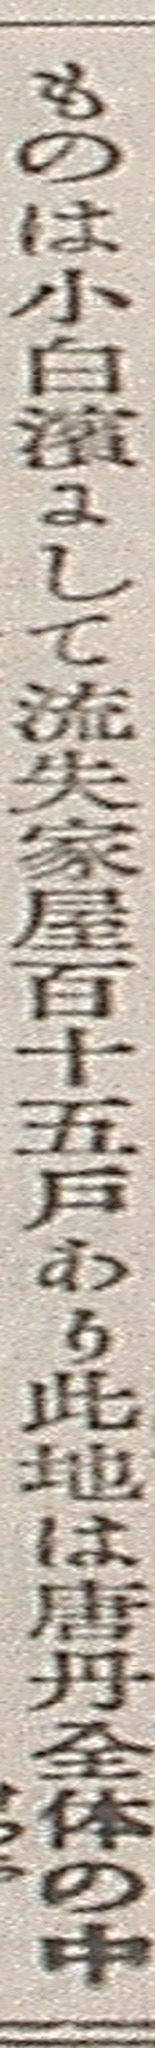ものは小白浜にして流失家屋百十五戸あり此地は唐丹全体の中
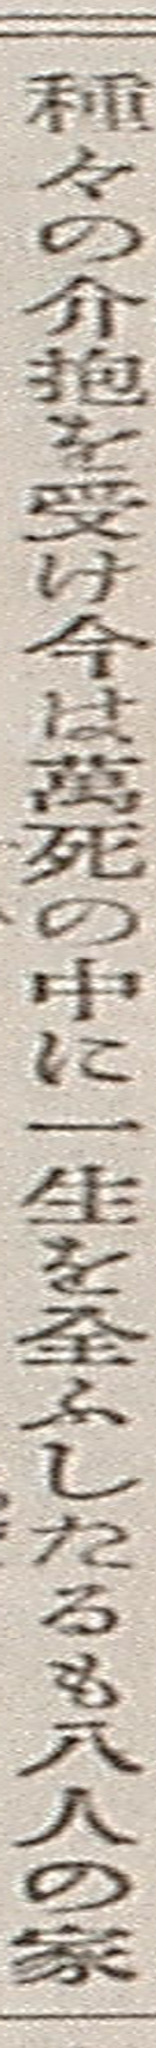種々の介抱を受け今は万死の中に一生を全ふしたるも八人の家
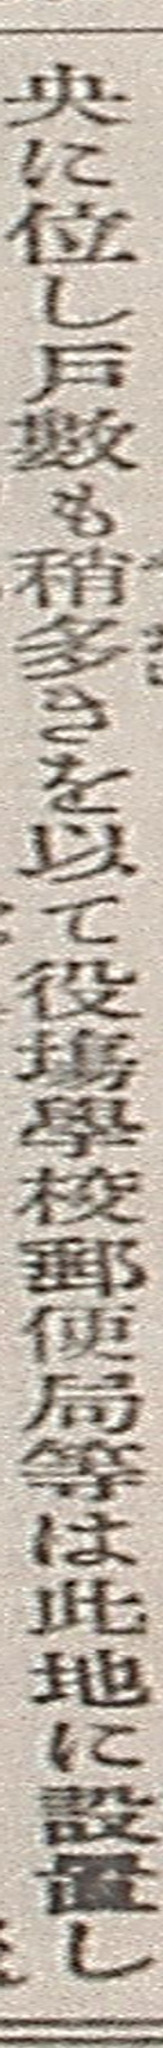央に位し戸数も稍多きを以て役場学校郵便局等は此地に設置し
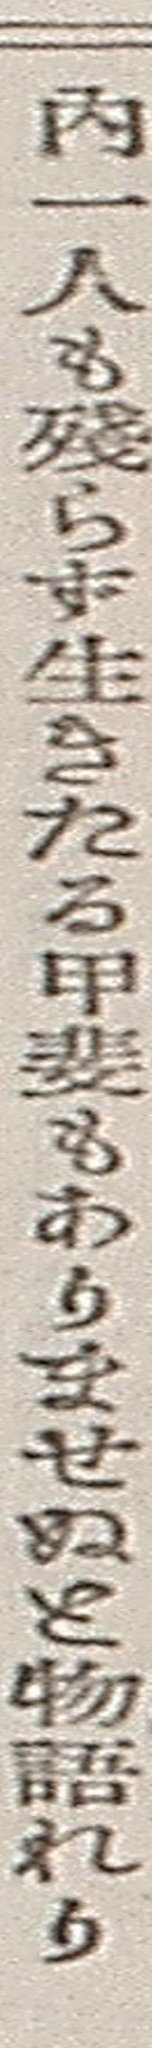内一人も残らず生きたる甲斐もありませぬと物語れり
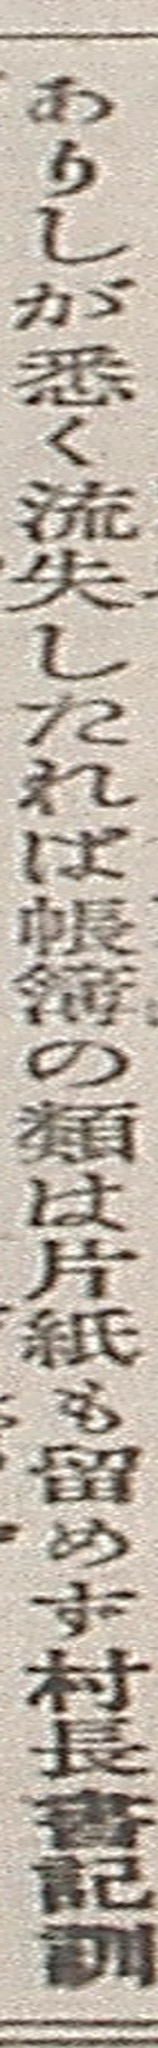ありしが悉く流失したれば帳簿の類は片紙も留めず村長書記訓
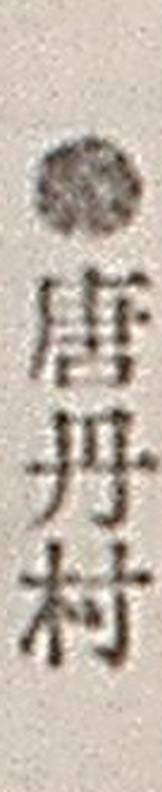●唐丹村
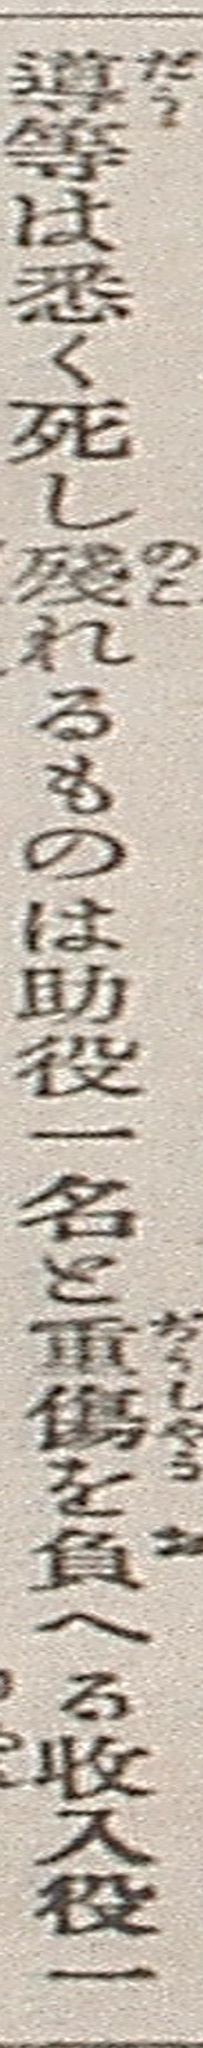導等は悉く死し残れるものは助役一名と重症を負へる収入役一
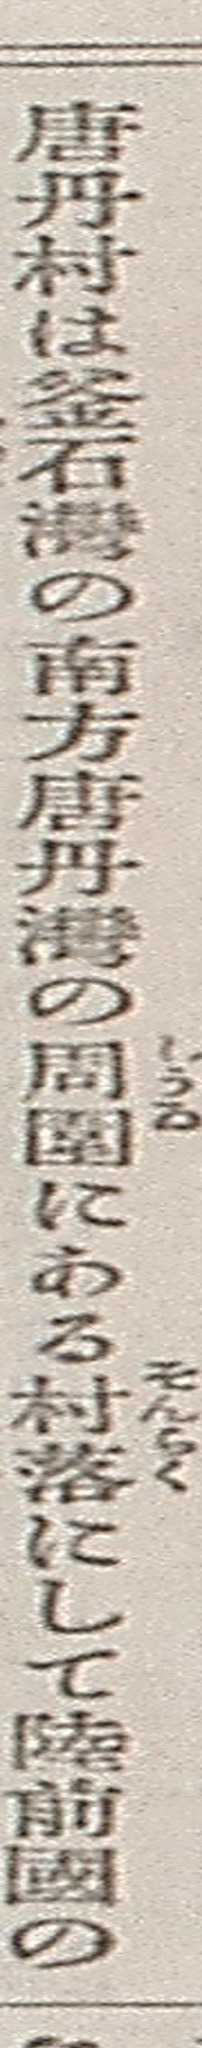唐丹村は釜石湾の南方唐丹湾の周囲にある村落にして陸前国の
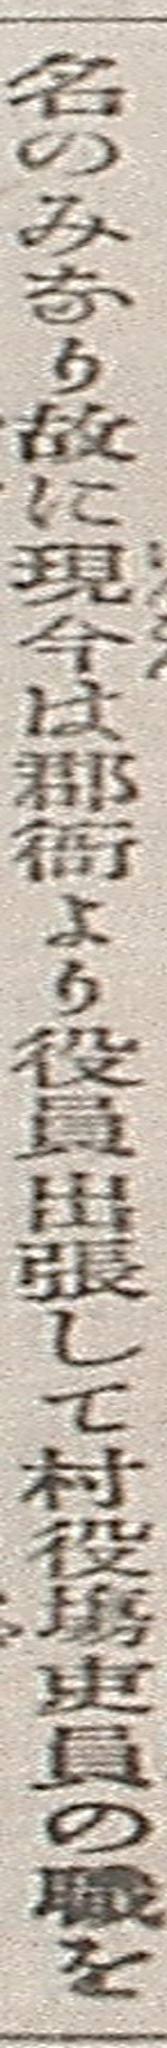名のみなり故に現今は郡衙より役員出張して村役場吏官の職を
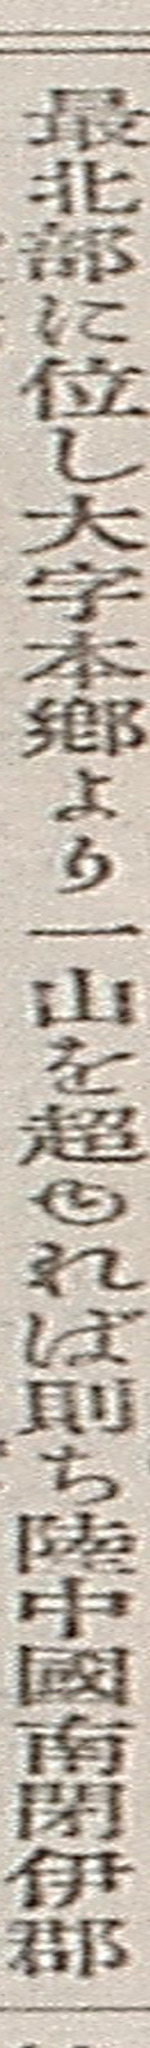最北部に位し大字本郷より一山を超ゆれば則ち陸中国南閉伊郡
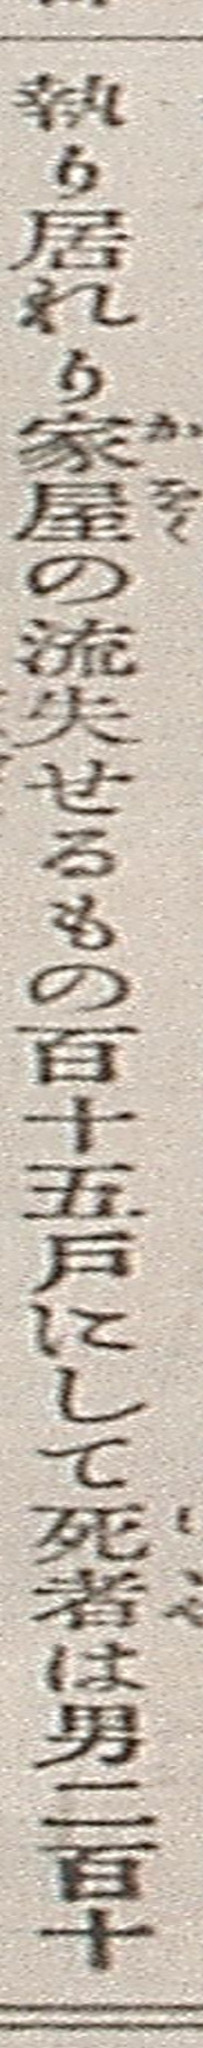執り居れり家屋の流失せるもの百十五戸にして死者は男ニ百十
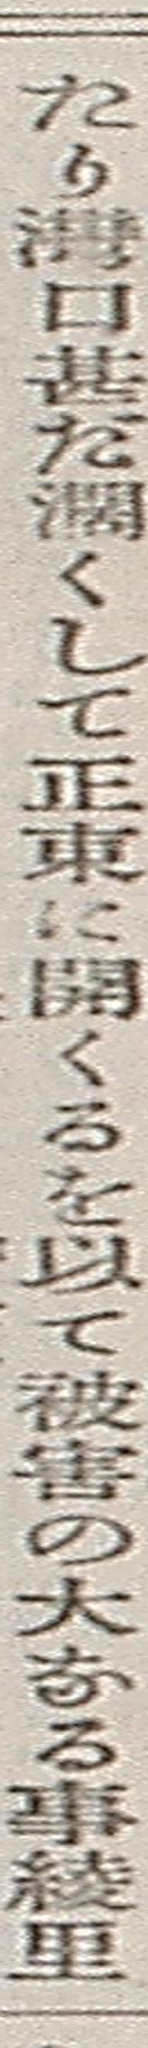たり湾口甚だ濶くして正東に開くるを以て被害の大なる事綾里
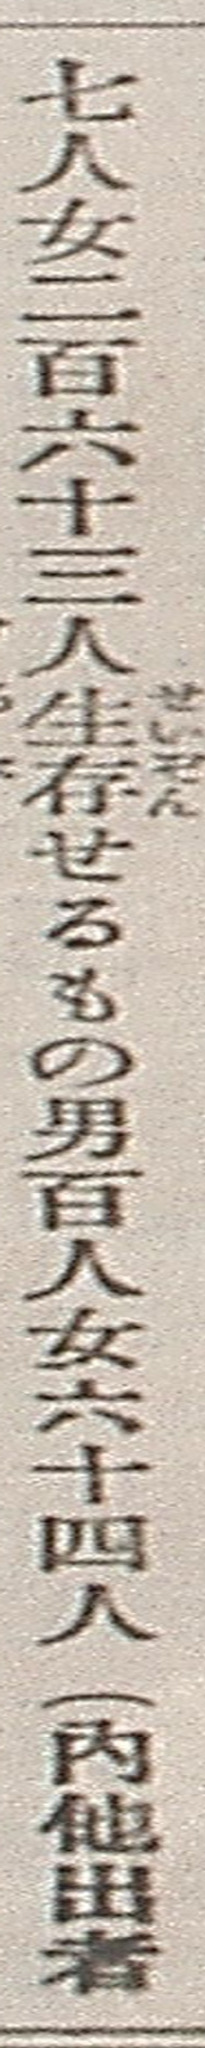七人女ニ百六十三人生存せるもの男百人女六十四人（内他出者
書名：風俗畫報臨時増刊第百十九號　大海嘯被害録（中）
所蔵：東京大学地震研究所図書室 Earthquake Research Institute Library, The University of Tokyo, JAPAN
